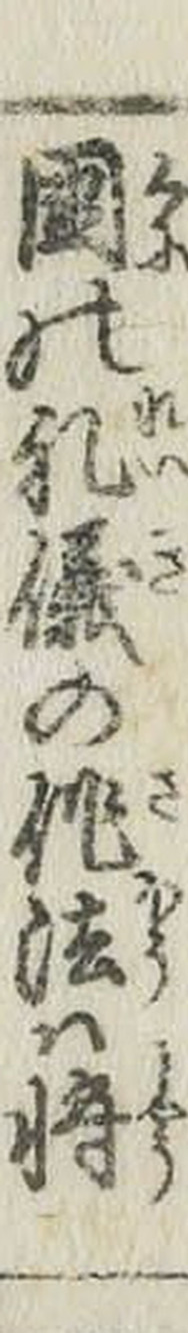国の礼儀の作法は将
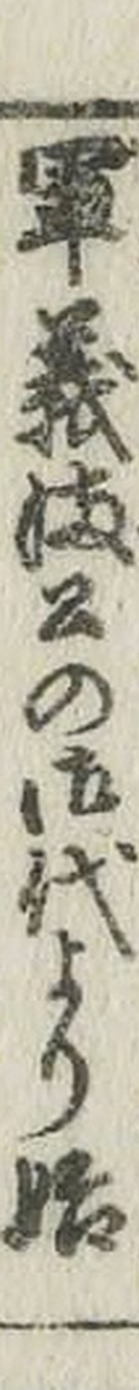軍義満公の御代より始
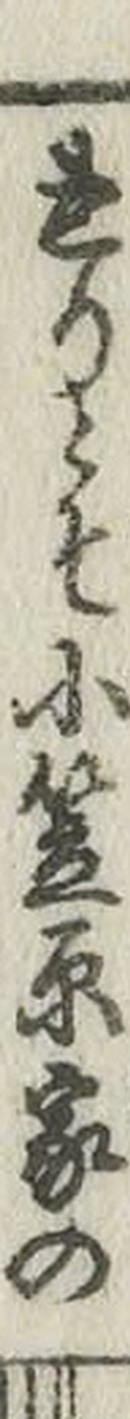れりとぞ小笠原家の
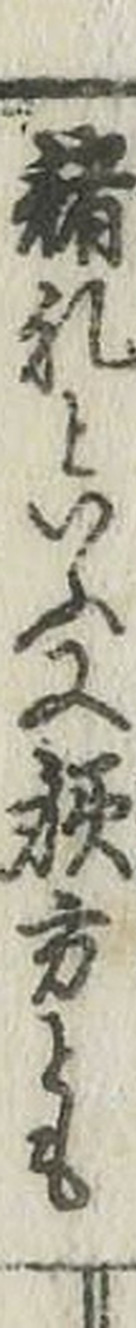諸礼といふ又躾方とも
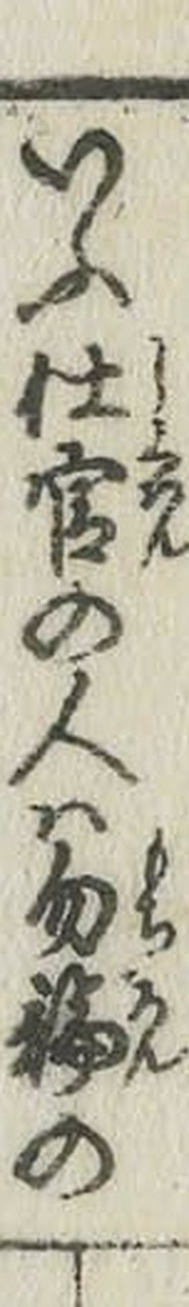いふ仕官の人は勿論の
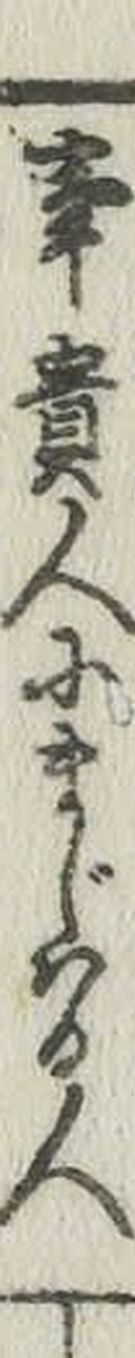事貴人にまじはる人
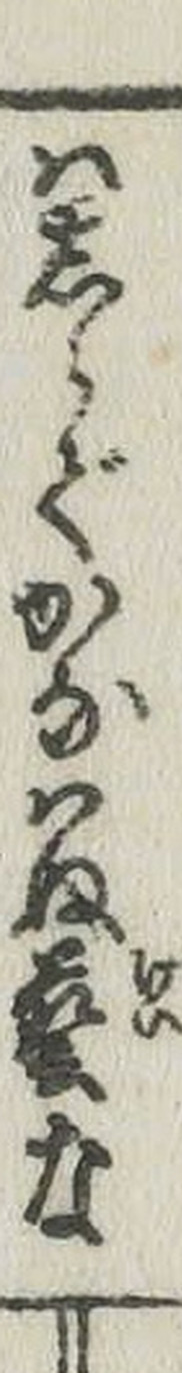はしらでかなはぬ芸な
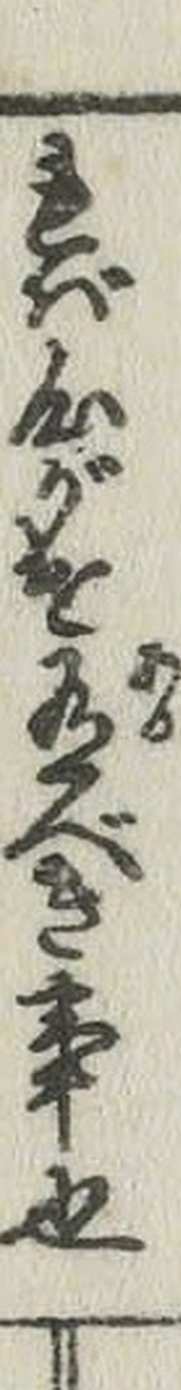れば心がけ有べき事也

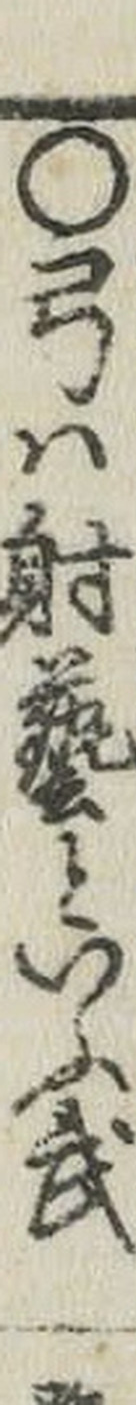○弓は射芸といふ武
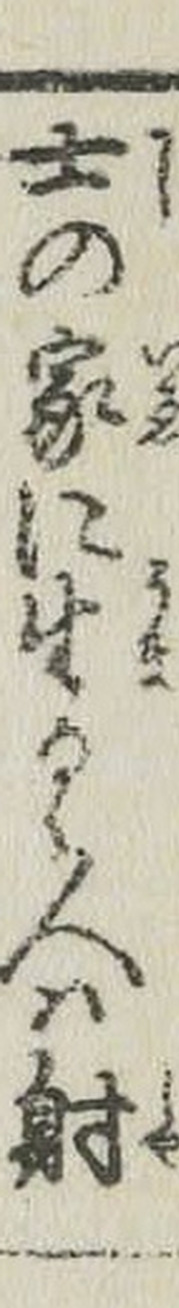士の家に生るゝ人は射
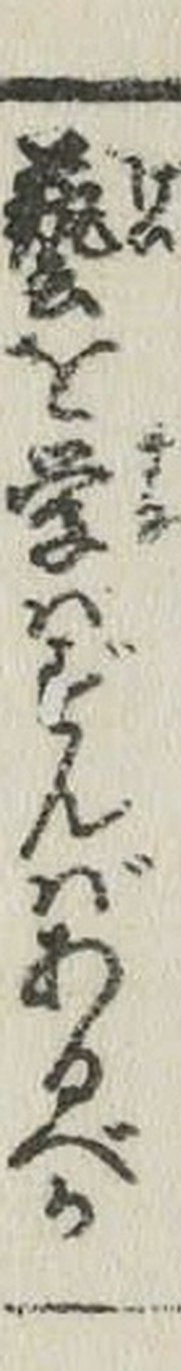芸を学はずんばあるべか
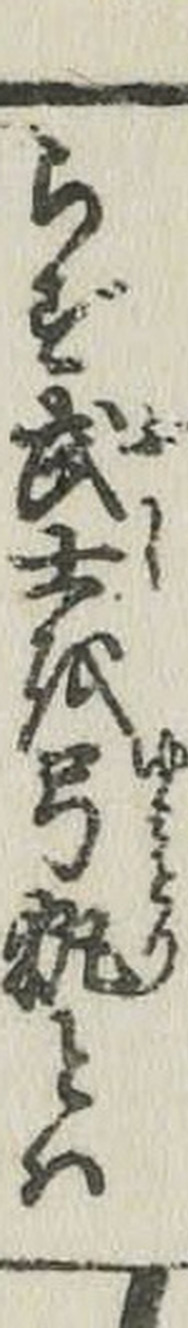らず武士を弓執とは
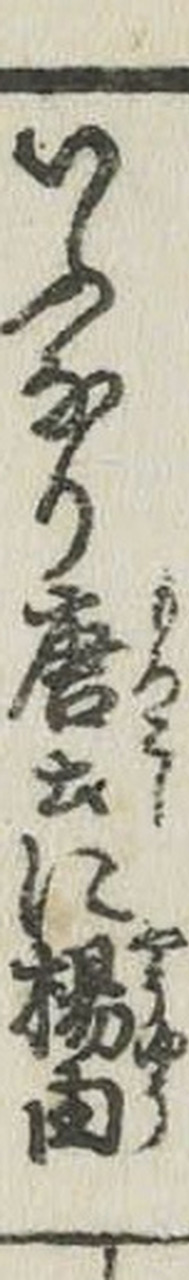いふなり唐土に楊由
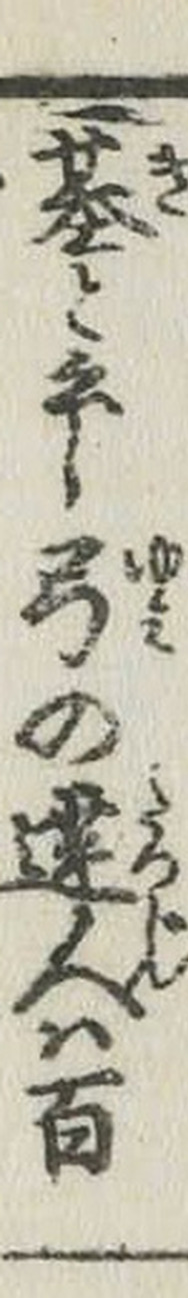基と云し弓の達人は百
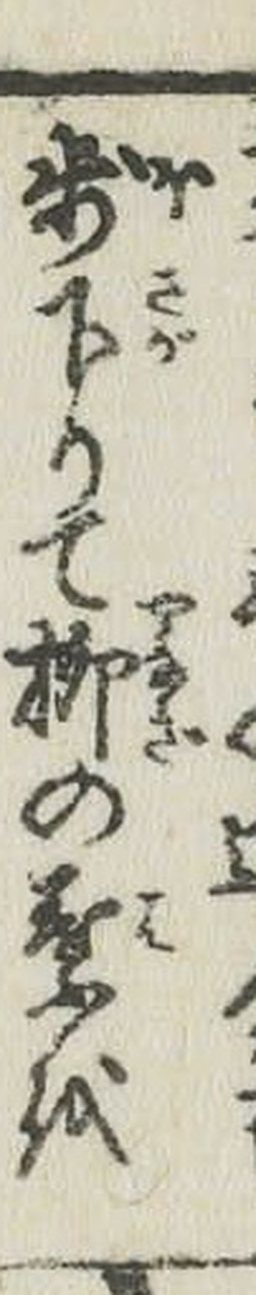歩下りて柳の葉を
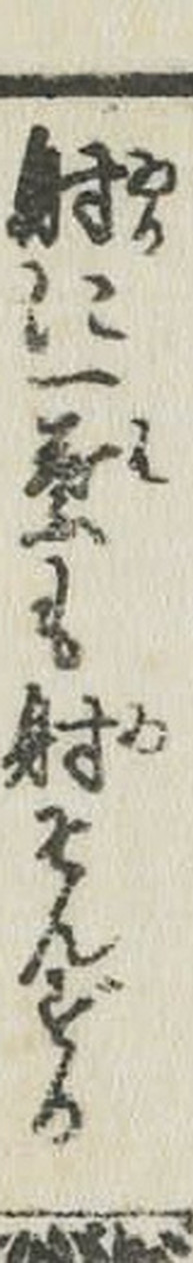射に一葉も射そんずる
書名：増補頭書訓蒙図彙大成 10巻 10:巻之21
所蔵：東京学芸大学教育コンテンツアーカイブ
